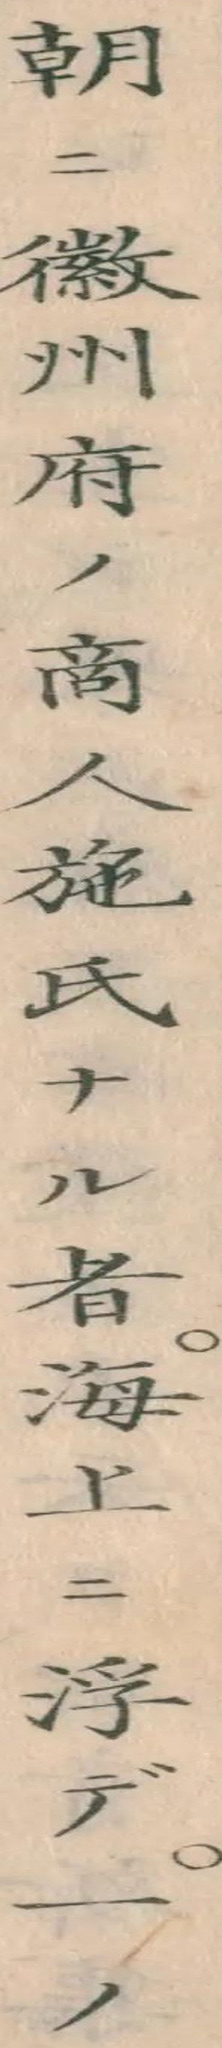朝ニ徽州府ノ商人施氏ナル者。海上ニ浮デ。一ノ
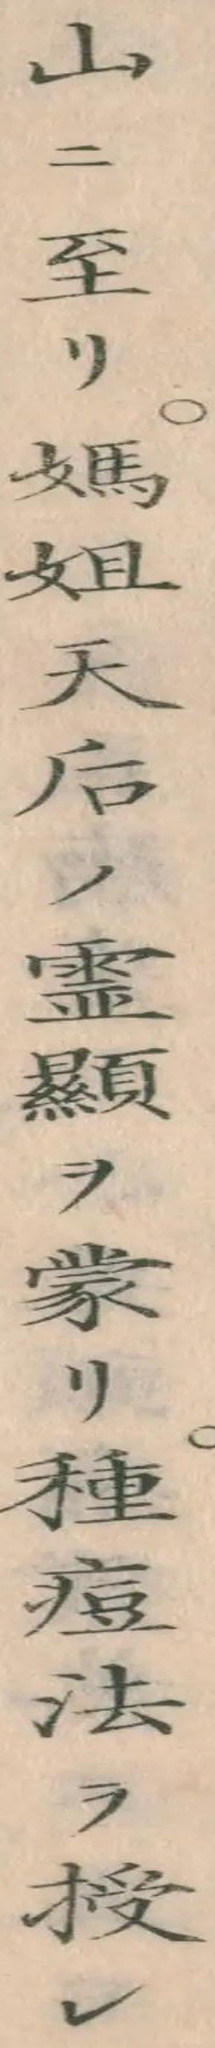山ニ至リ。媽姐天后ノ霊顕ヲ蒙リ。種痘法ヲ授レ
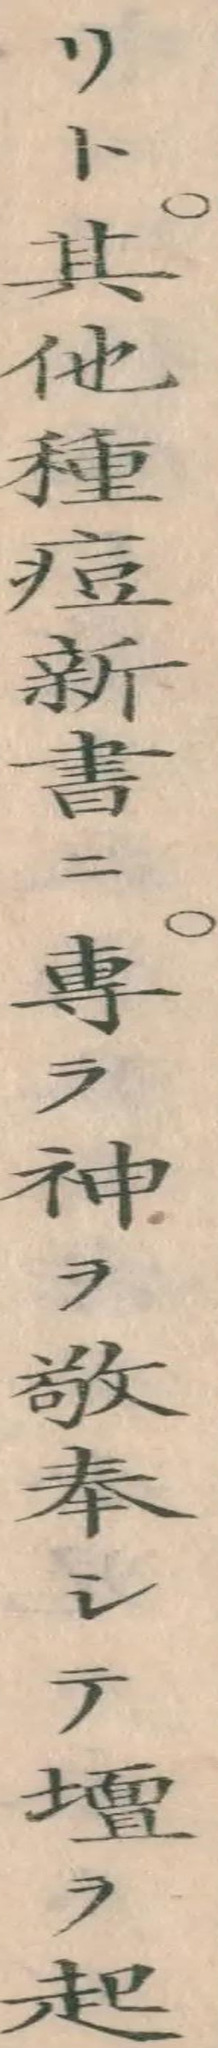リト。其他種痘新書ニ。専ラ神ヲ敬奉シテ壇ヲ起
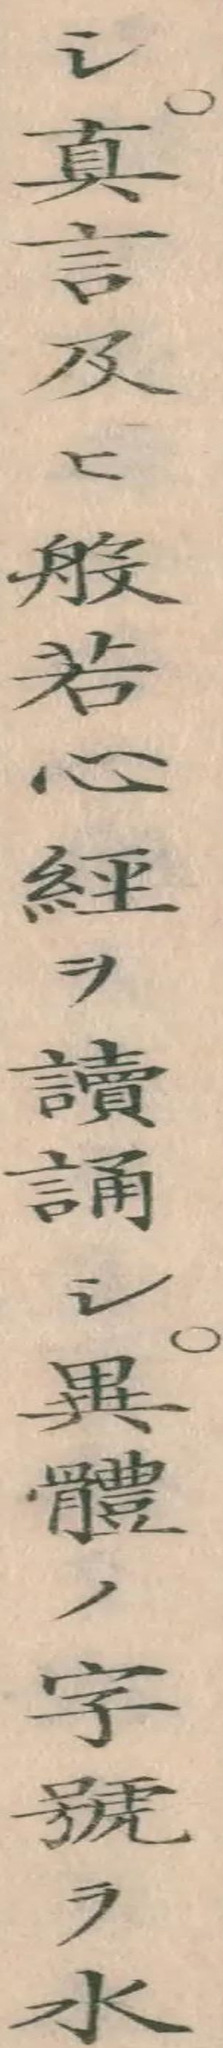シ。真言及ヒ般若心経ヲ読誦シ。異体ノ字号ヲ水
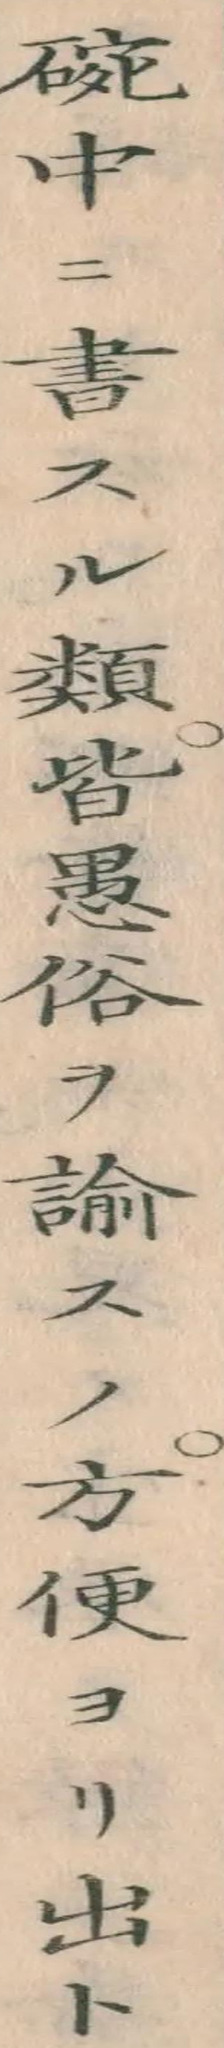碗中ニ書スル類。皆愚俗ヲ諭スノ。方便ヨリ出ト
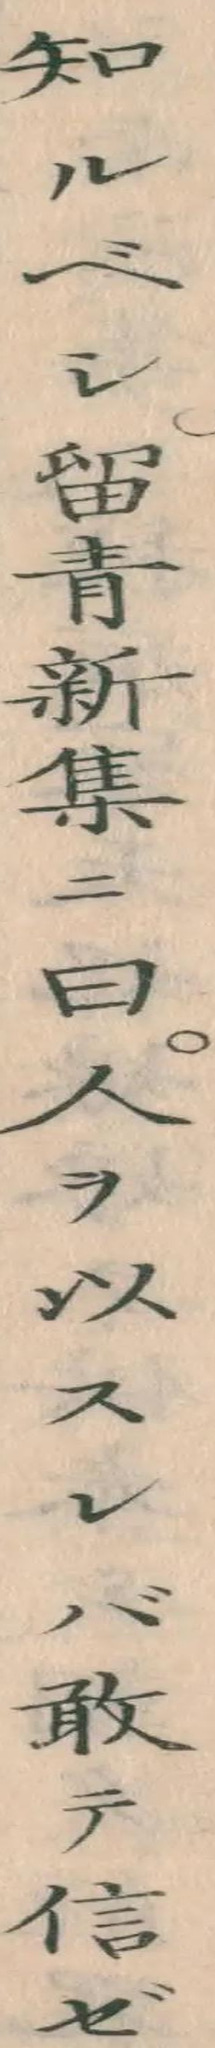知ルベシ。留青新集ニ曰。人ヲ以スレバ敢テ信ゼ
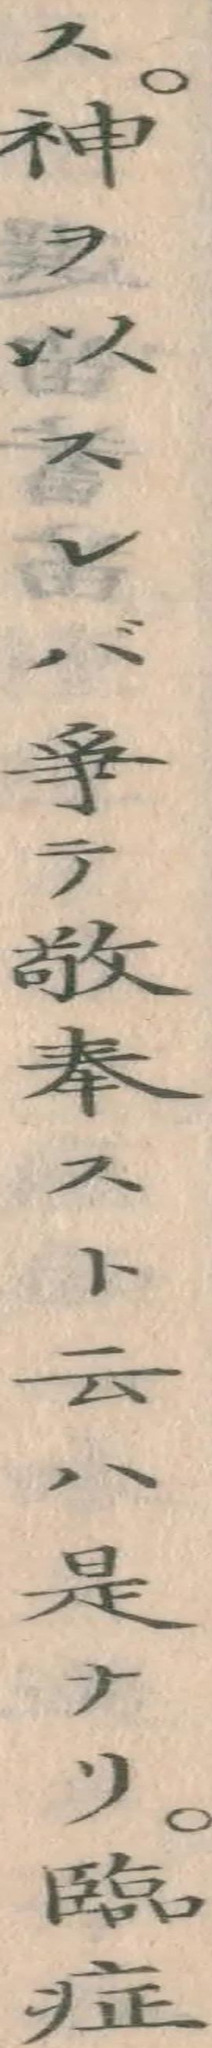ス。神ヲ以スレバ争テ敬奉スト云ハ是ナリ。臨症
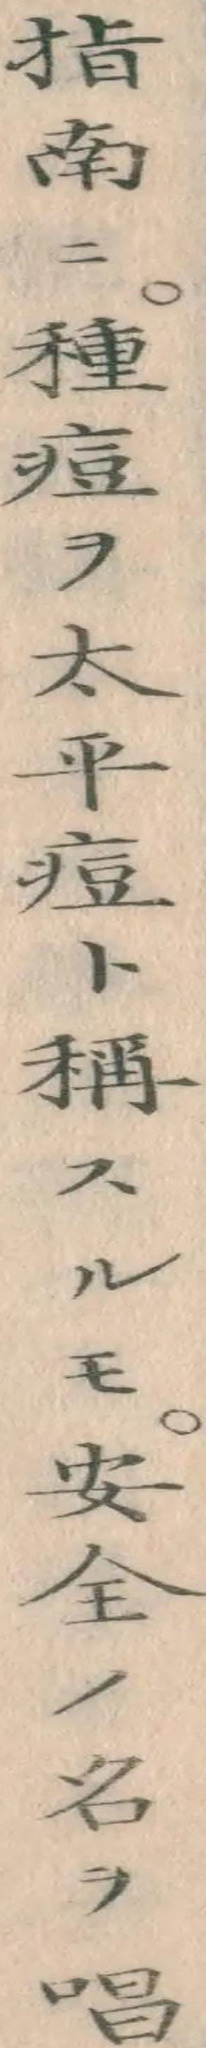指南ニ。種痘ヲ太平痘ト称スルモ。安全ノ名ヲ唱
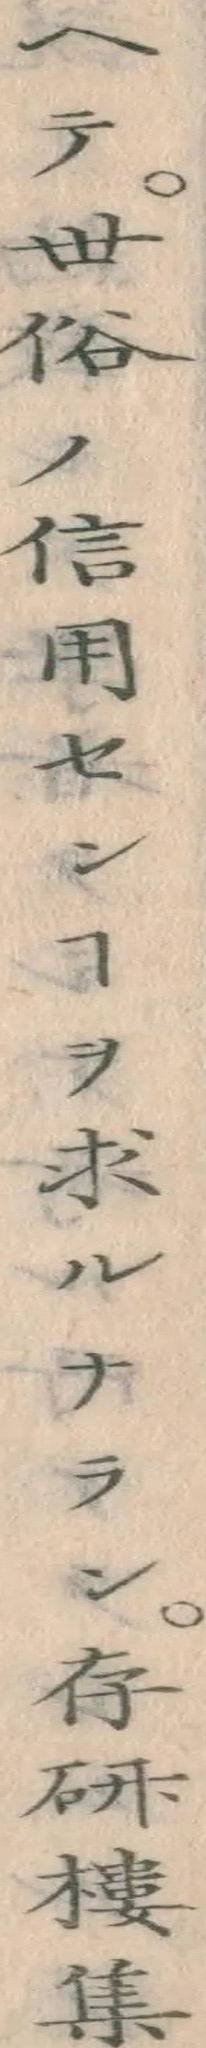ヘテ。世俗ノ信用センヿヲ求ルナラン。存研楼集
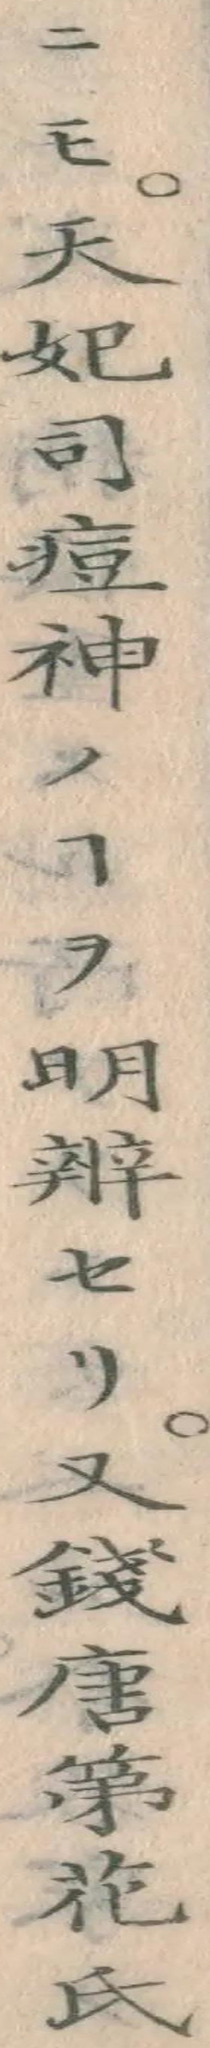ニモ。天妃司痘神ノヿヲ明弁セリ。又銭唐第花氏
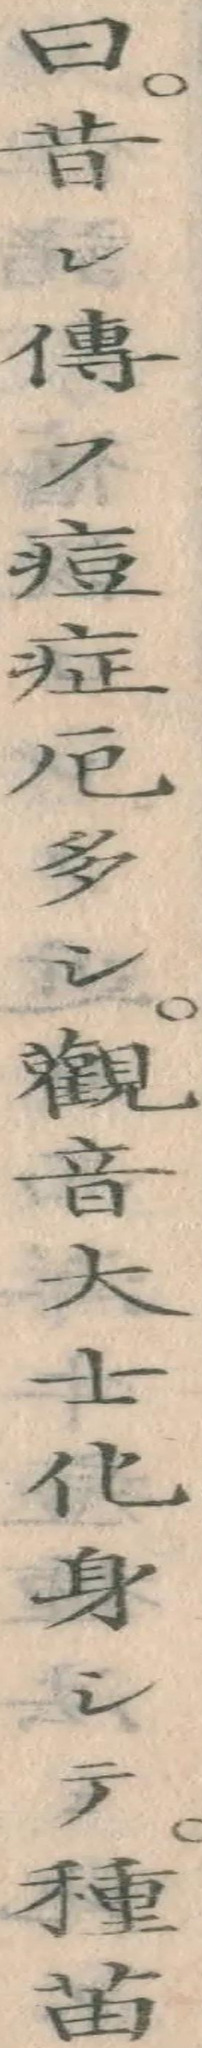曰。昔レ伝フ痘症厄多シ。観音大士化身シテ。種苗
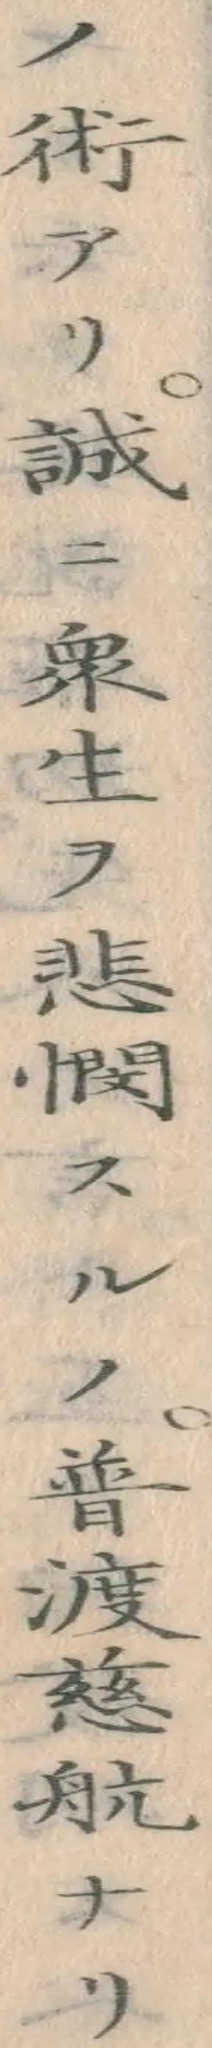ノ術アリ。誠ニ衆生ヲ悲憫スルノ。普渡慈航ナリ
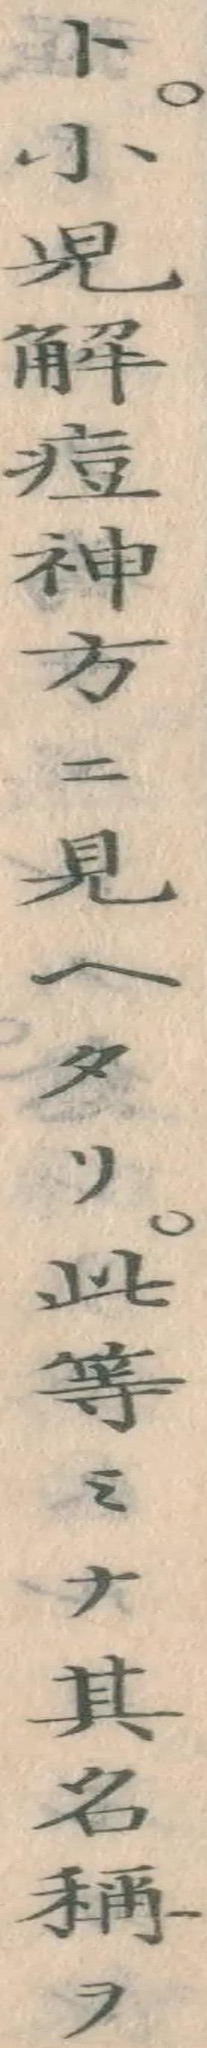ト。小児解痘神方ニ見ヘタリ。此等ミナ其名称ヲ
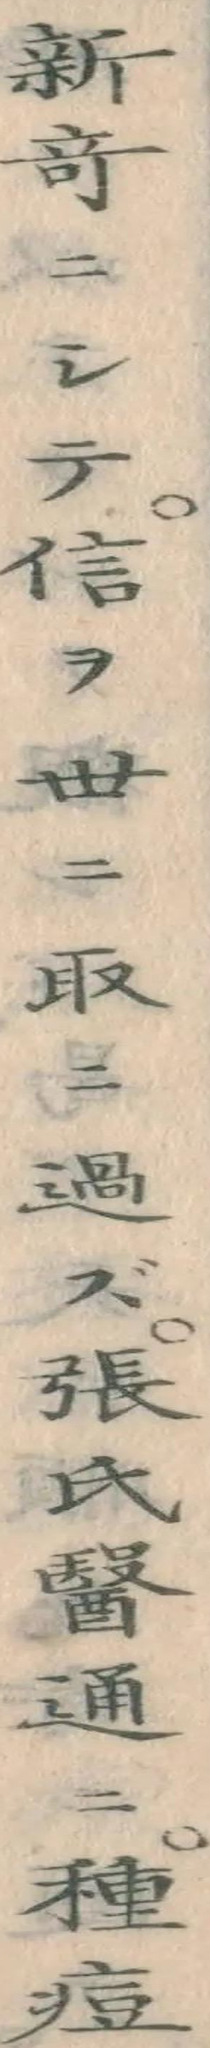新奇ニシテ。信ヲ世ニ取ニ過ズ。張氏医通ニ。種痘
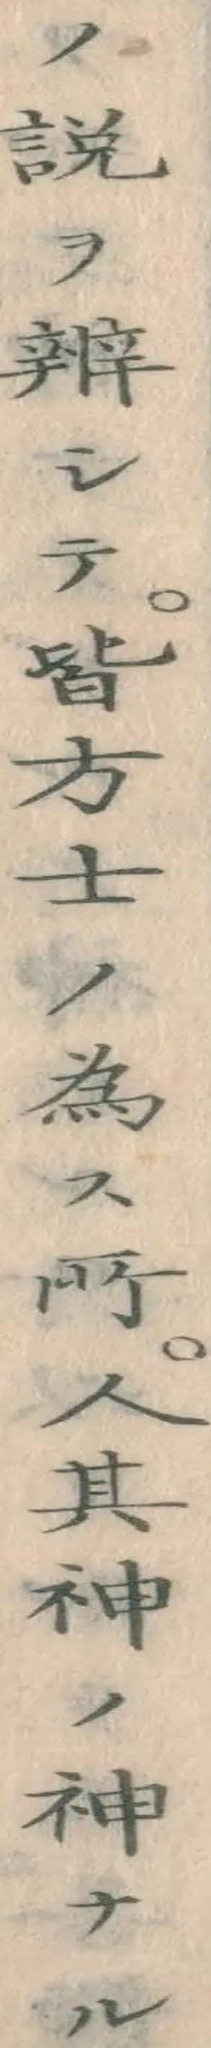ノ説ヲ弁シテ。皆方士ノ為ス所。人其神ノ神ナル

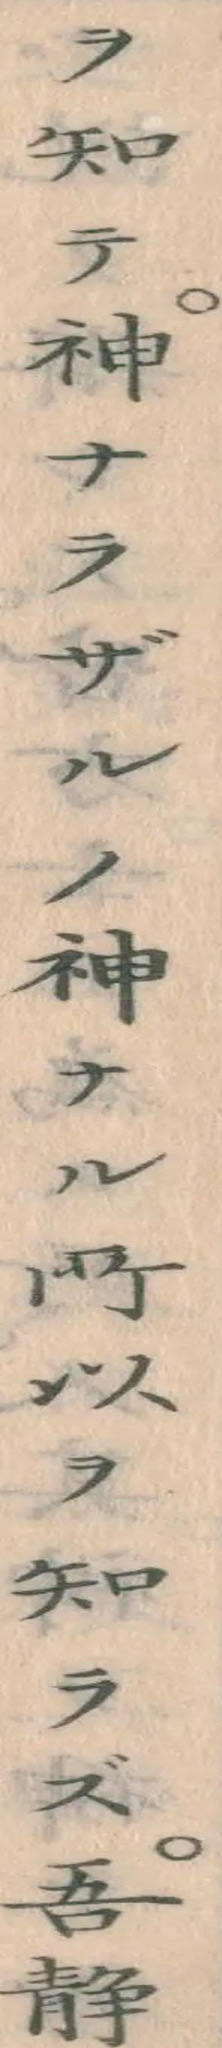ヲ知テ。神ナラザルノ神ナル所以ヲ知ラズ。吾静
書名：種痘弁義
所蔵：国立国会図書館 National Diet Library, JAPAN
